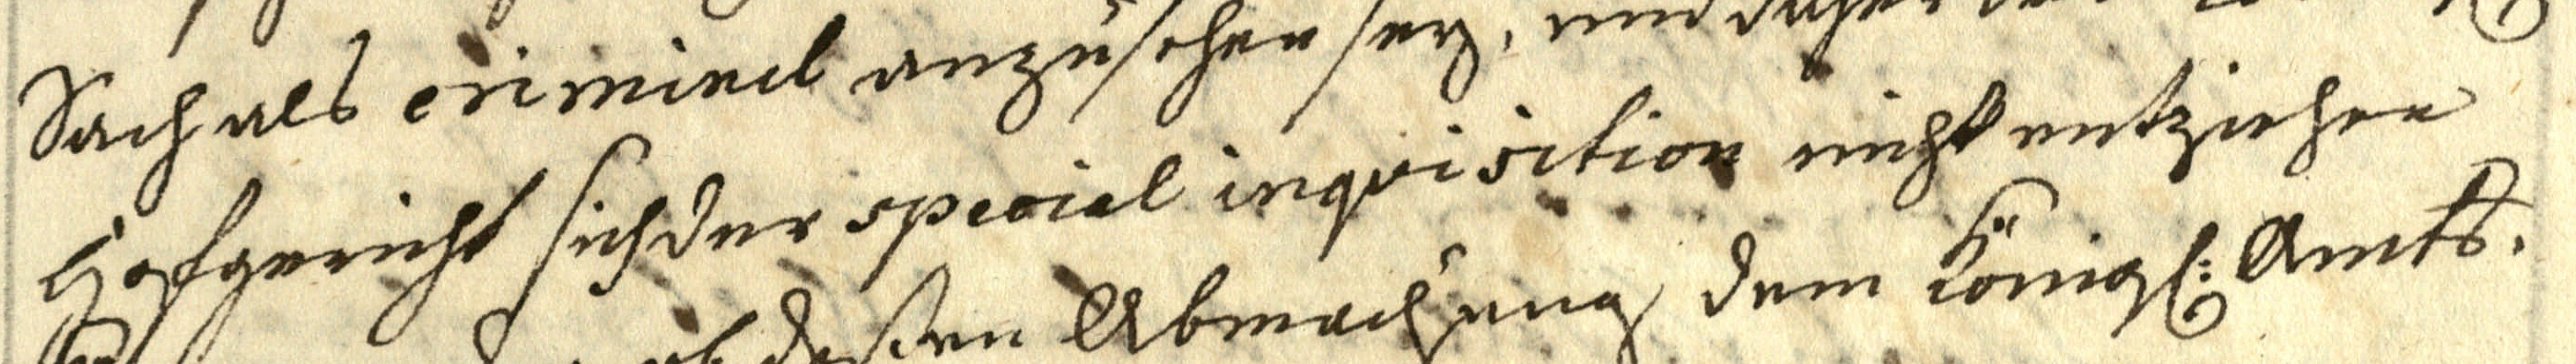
Hofgericht sich der special inquisition nicht entziehen
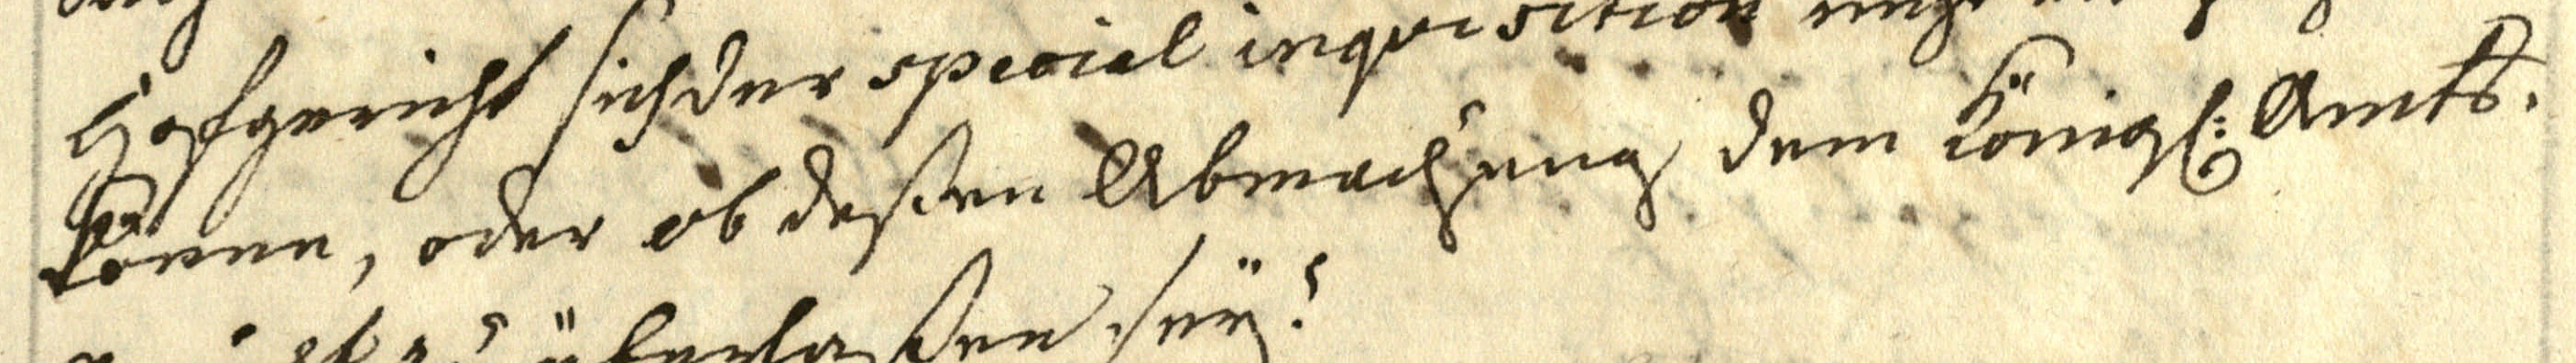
könne, oder ob deßen Abmachung, dem Königl. Amts¬
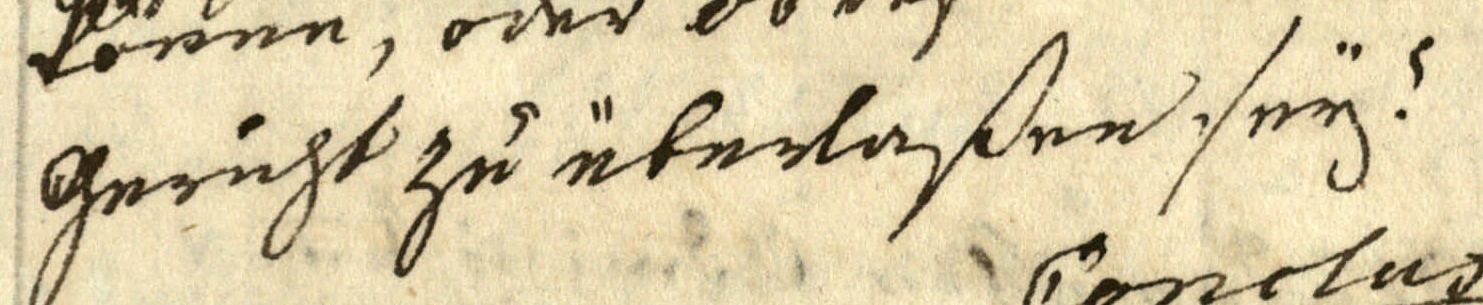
Gericht zu überlaßen seÿ?
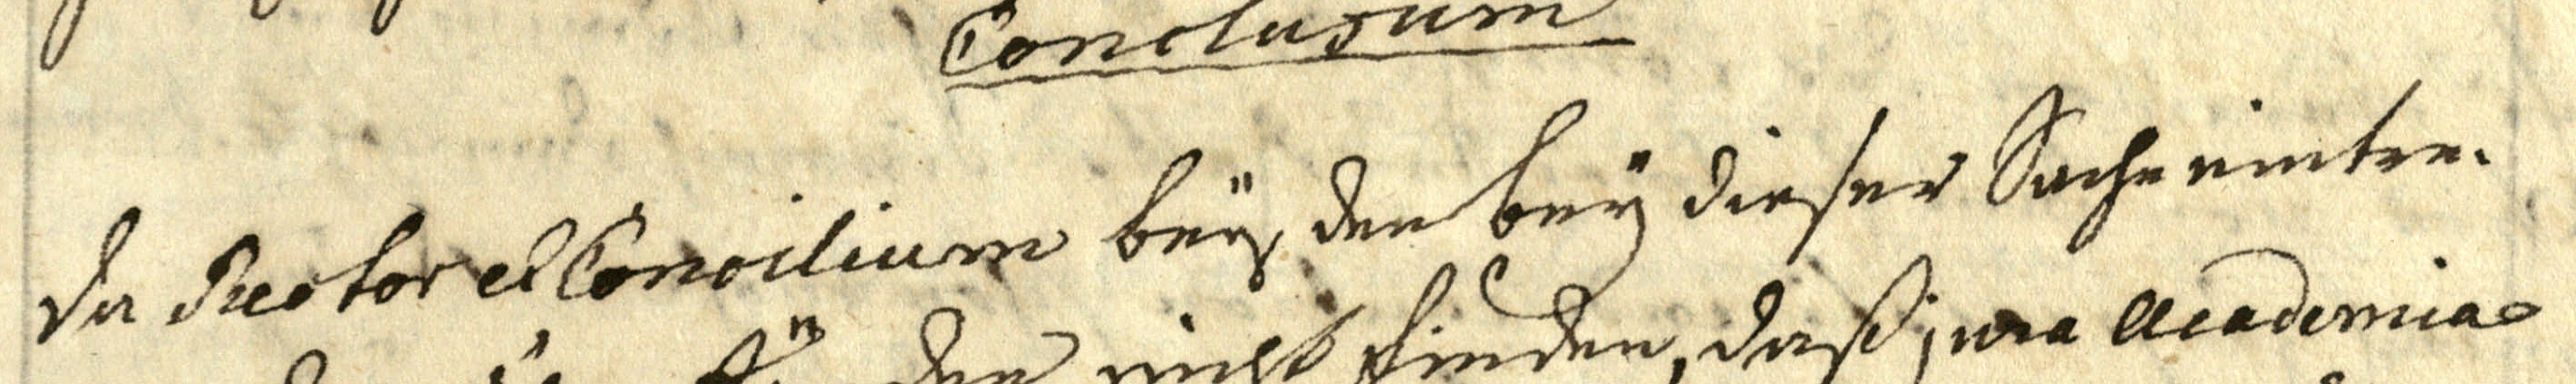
Da Rector et Concilium beÿ den beÿ dieser Sache eintre¬
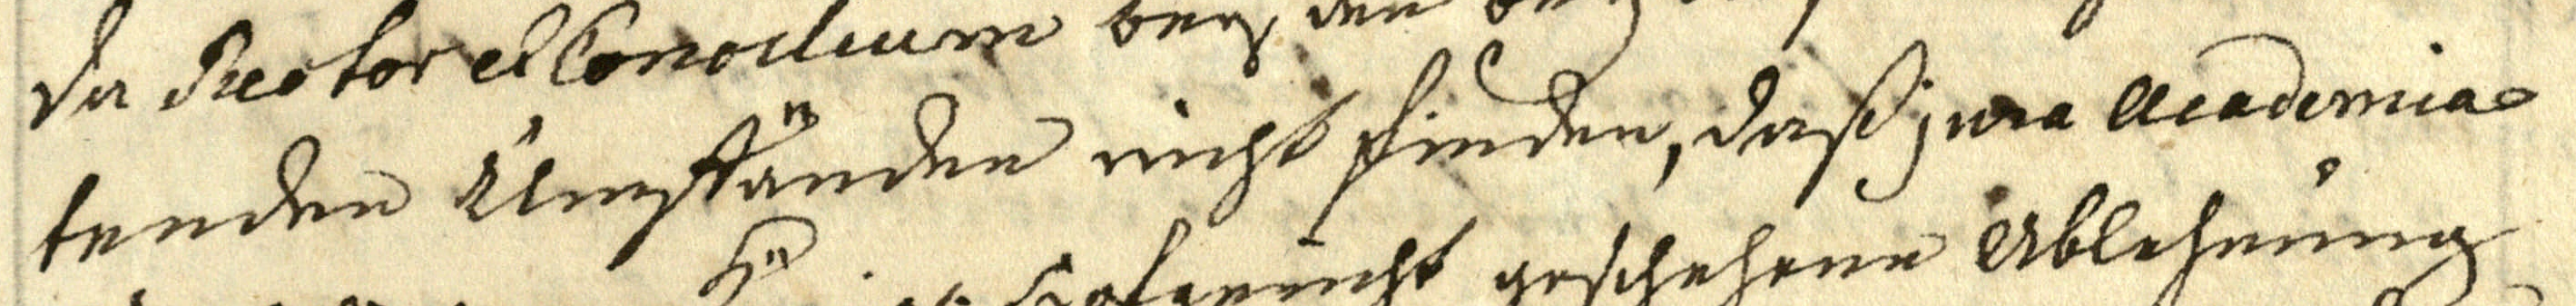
tenden Umständen nicht finden, daß jura Academiae
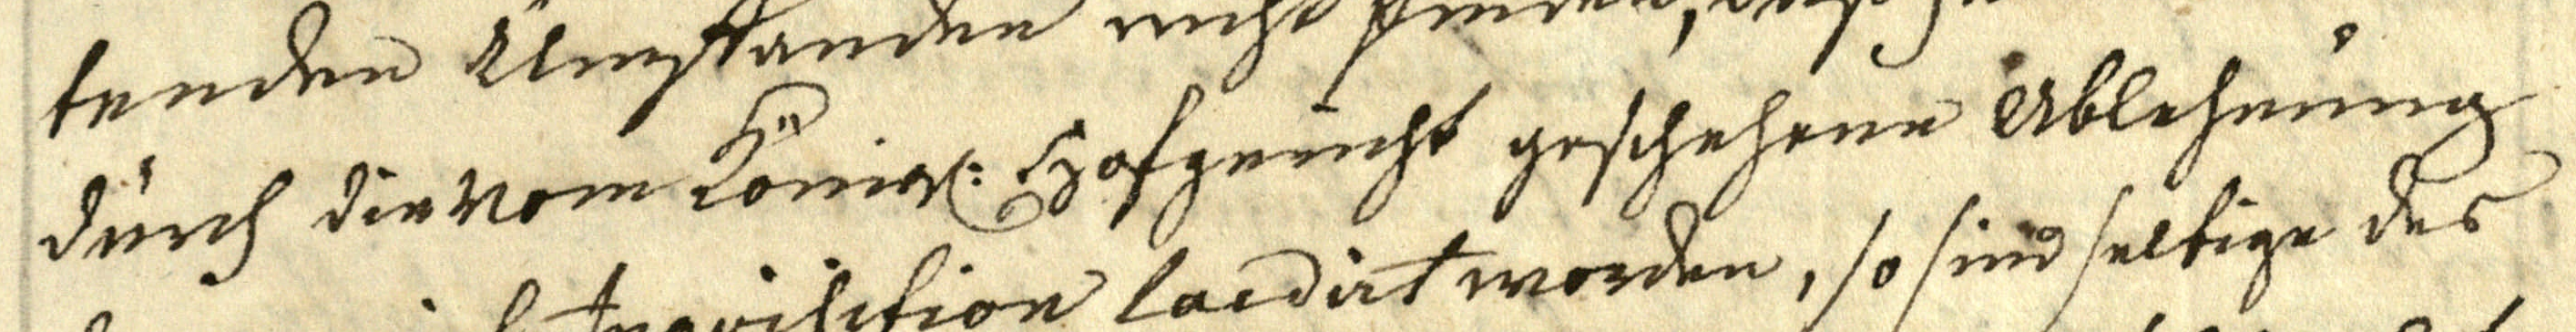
durch die vom Königl. Hofgericht geschehene Ablehnung
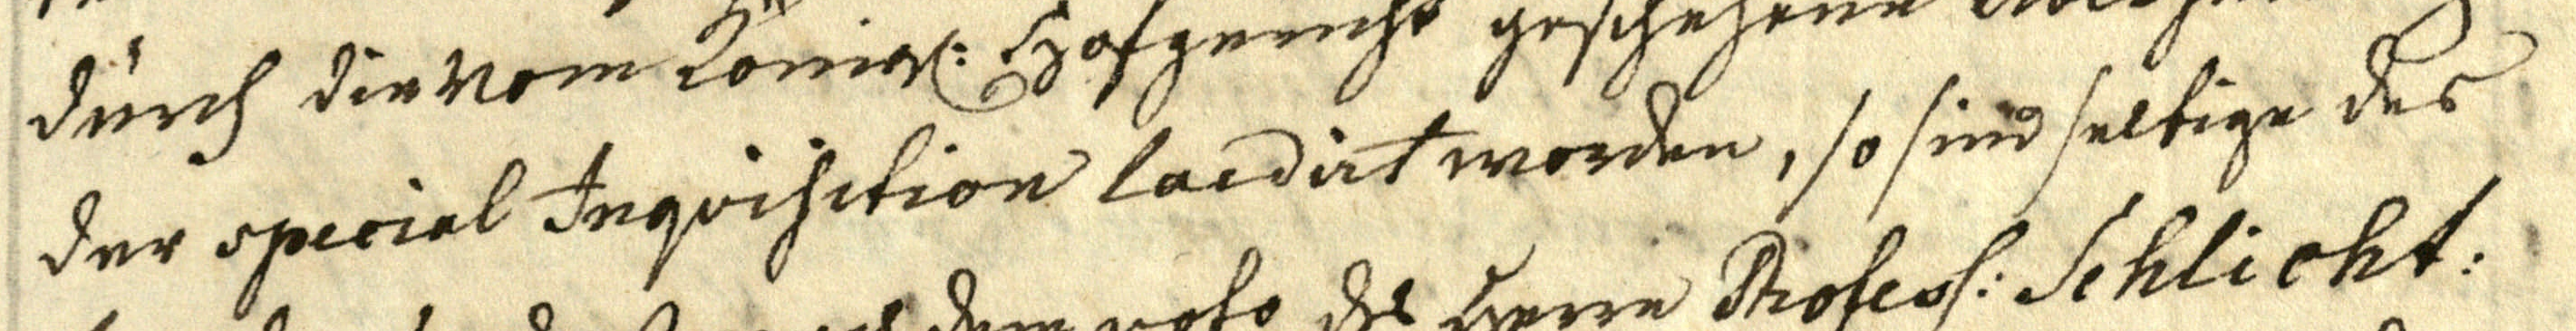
der special Inquisition laedirt worden, so sind selbige des
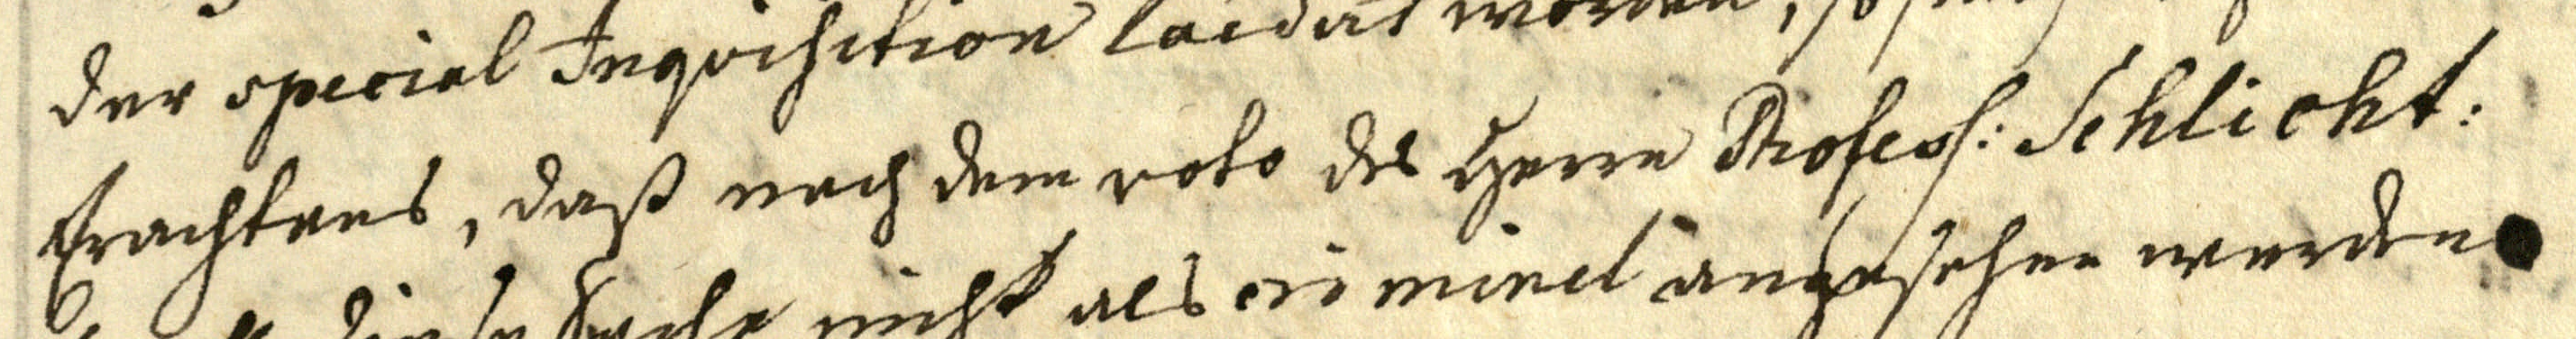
Erachtens, daß nach dem voto des Herrn Profess. Schlicht¬
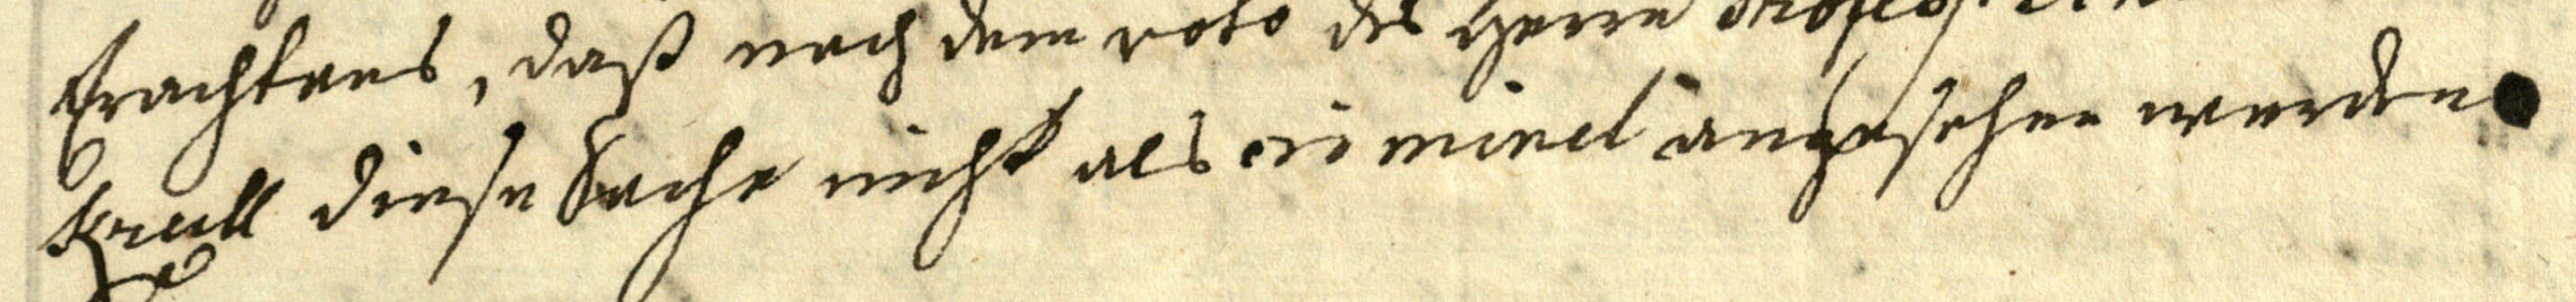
krull diese Sache nicht als criminel angesehen werden
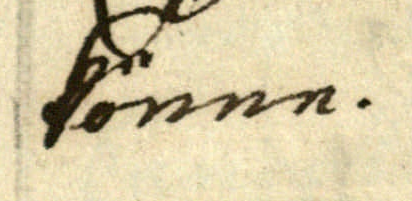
könne.
